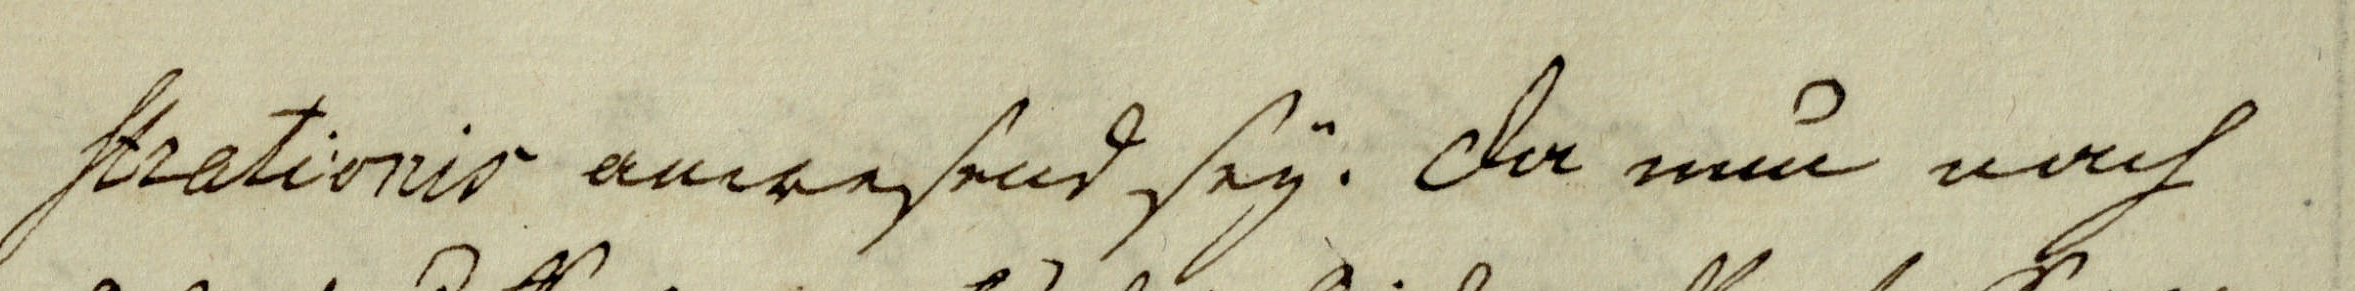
strationis anwesend seÿ. Da nun nach
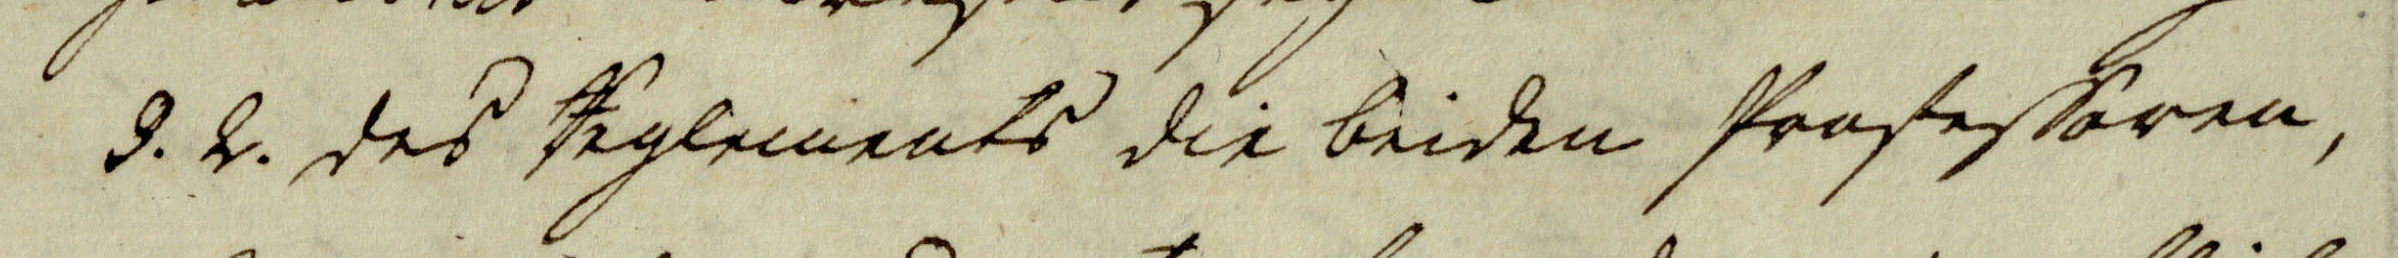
§. 2. des Reglements die beiden Professoren,
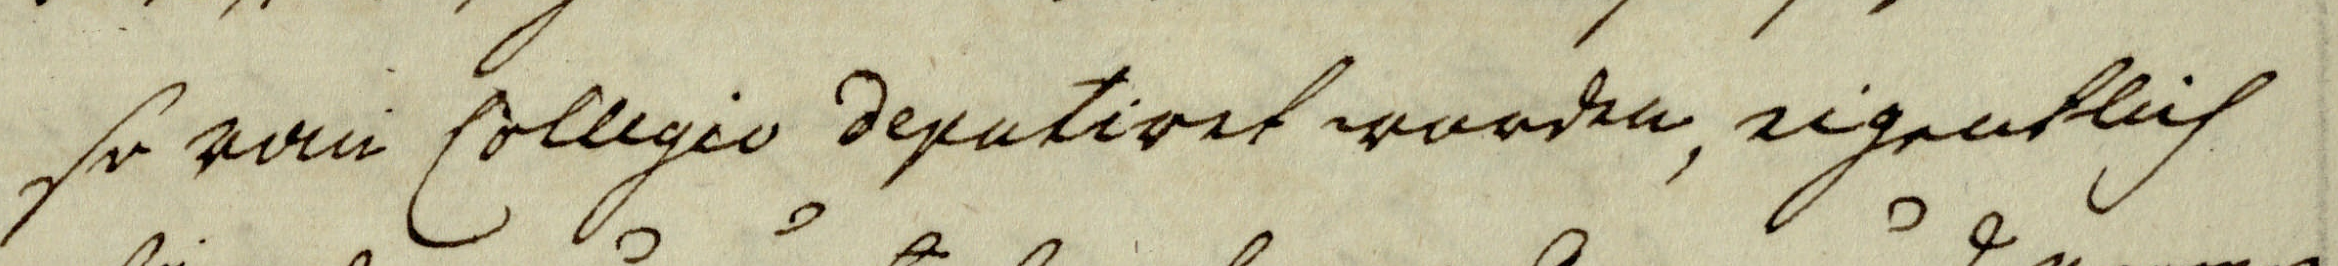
so vom Collegio deputiret worden, eigentlich
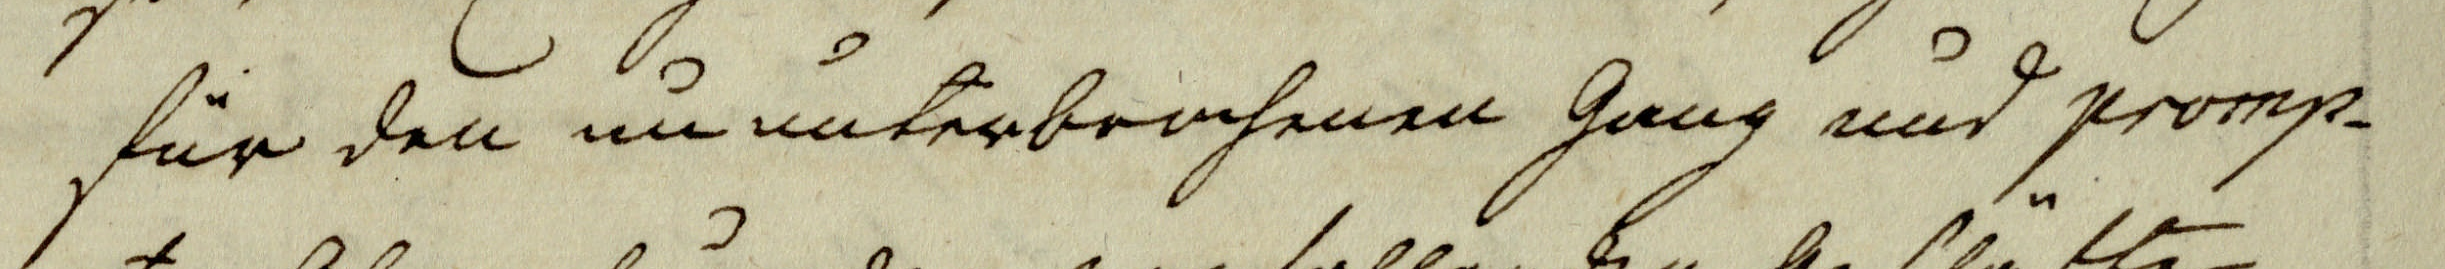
für den im unterbrochenen Gang und promp¬
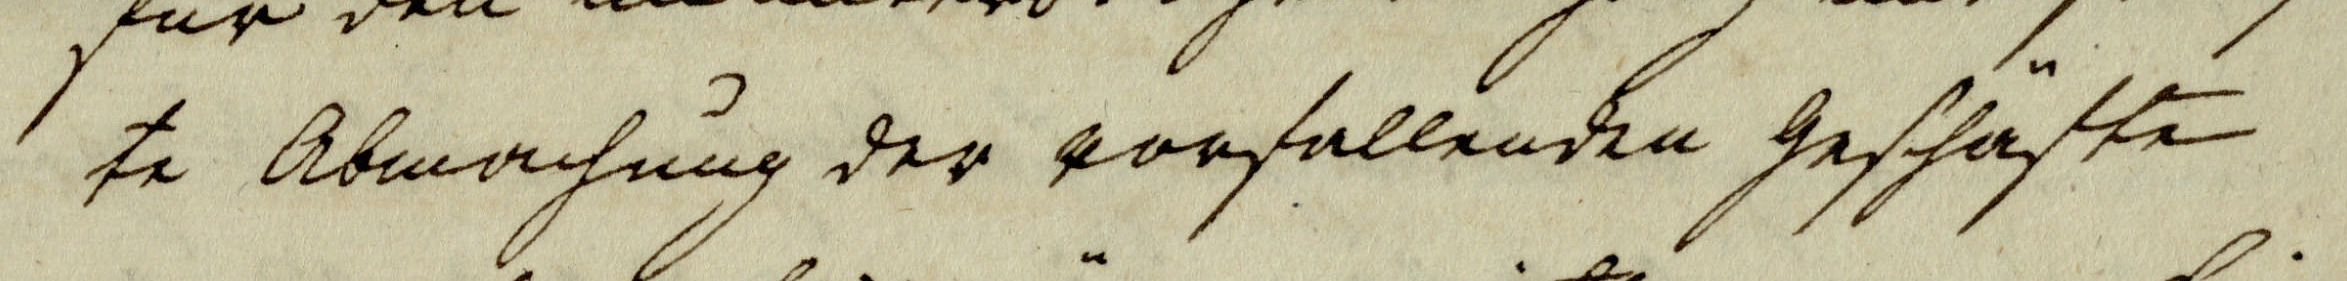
te Abmachung der vorfallenden Geschäfte
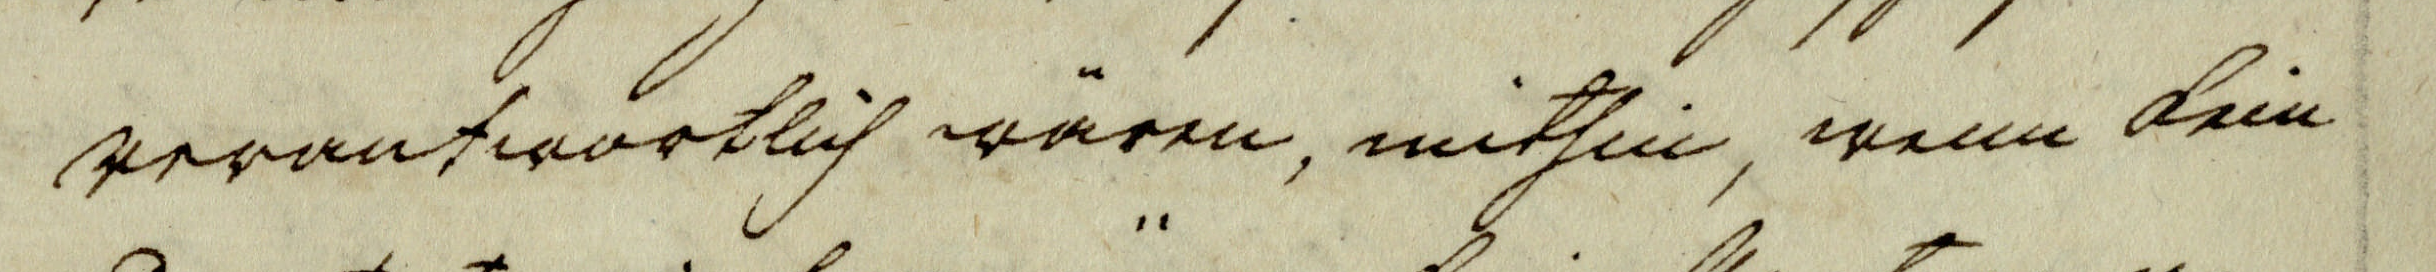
verantwortlich wären, mithin, wenn kein
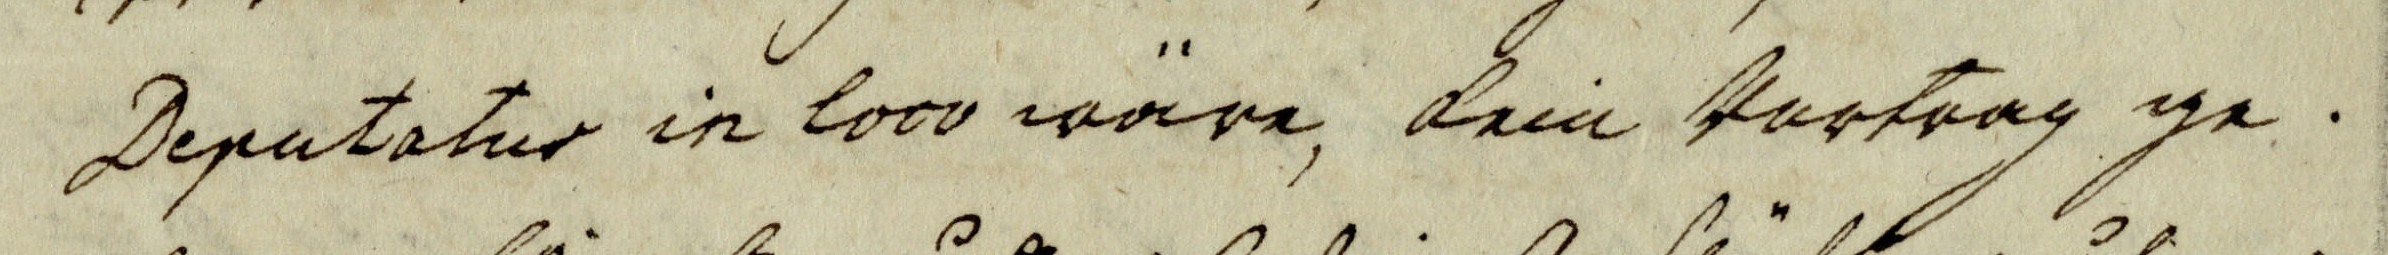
Deputatus in loco wäre, kein Vortrag ge¬
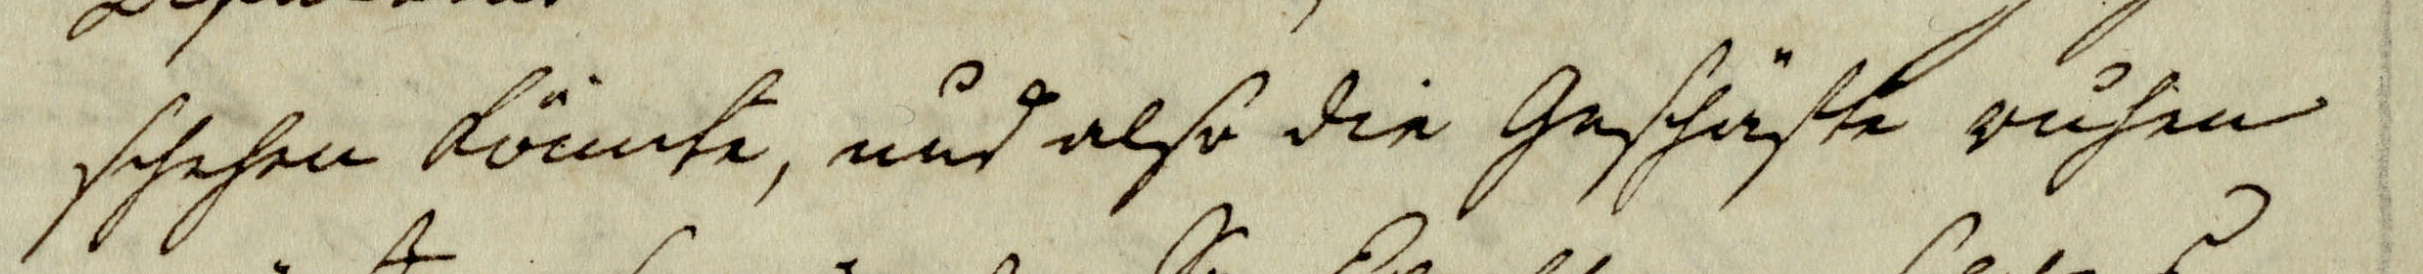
schehen könnte, und also die Geschäfte ruhen
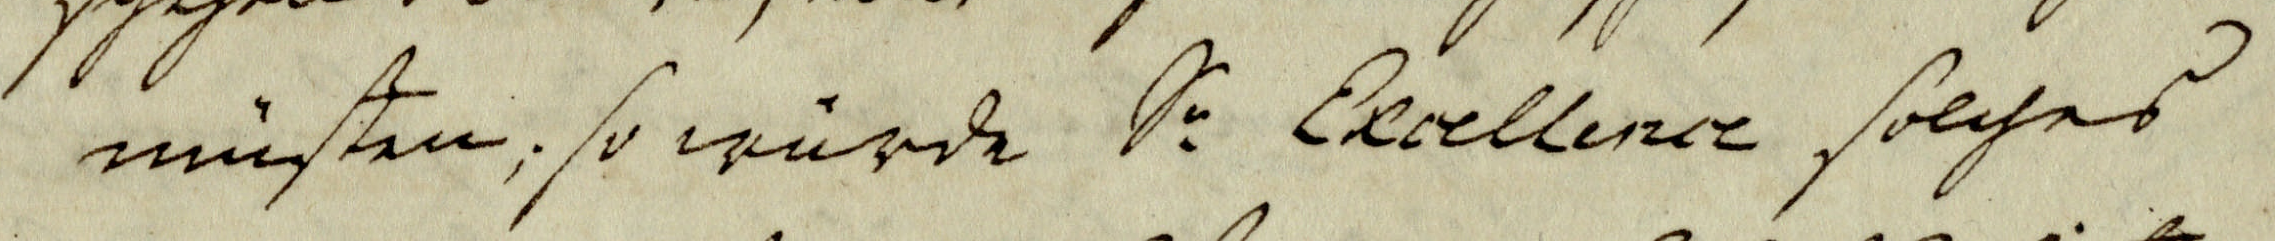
müßten, so würde Sr Excellence solches
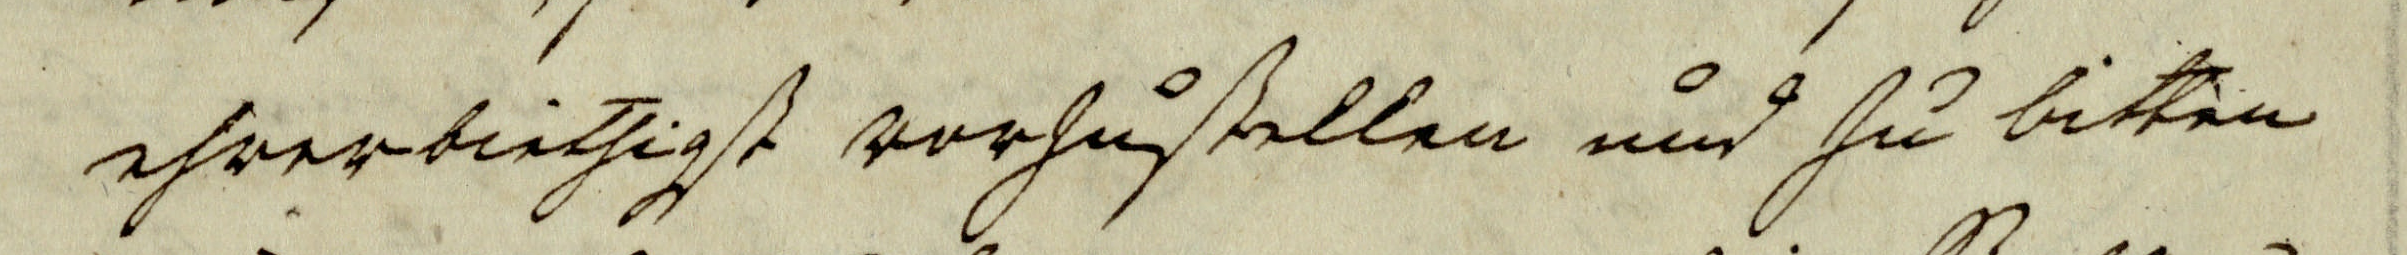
ehrerbiethigst vorzustellen und zu bitten
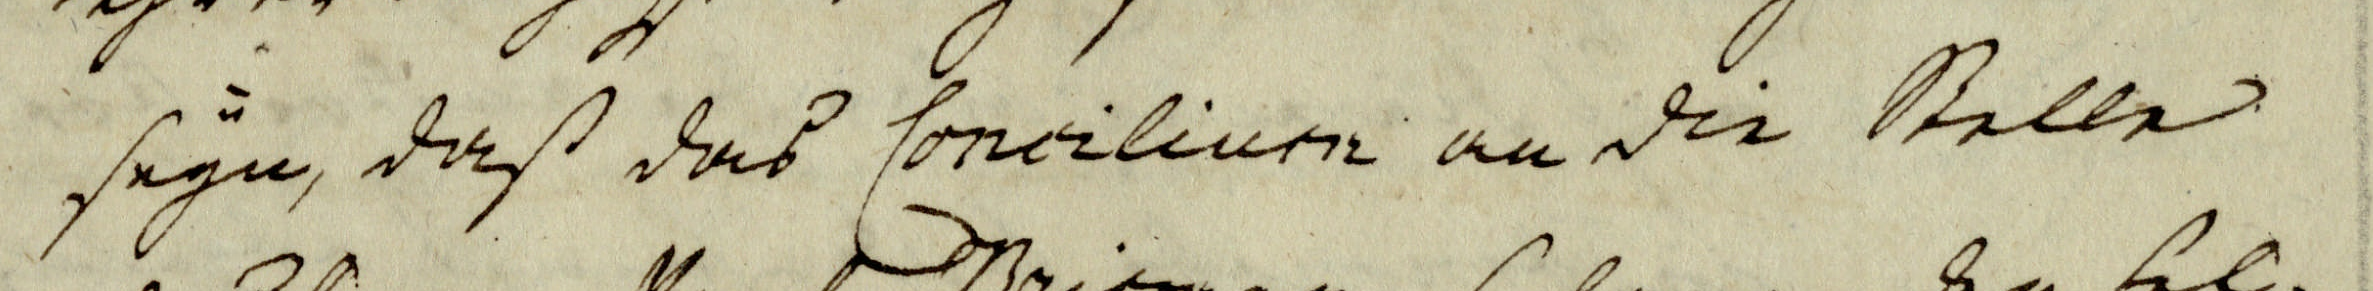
seÿn, daß das Concilium an die Stelle
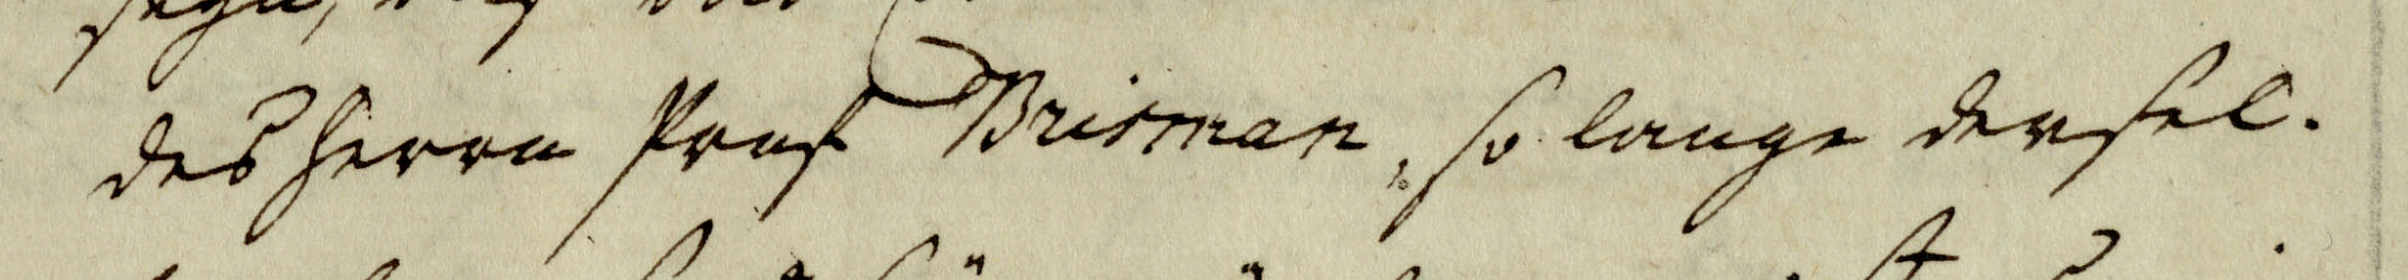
des Herrn Prof Brisman, so lange dersel¬
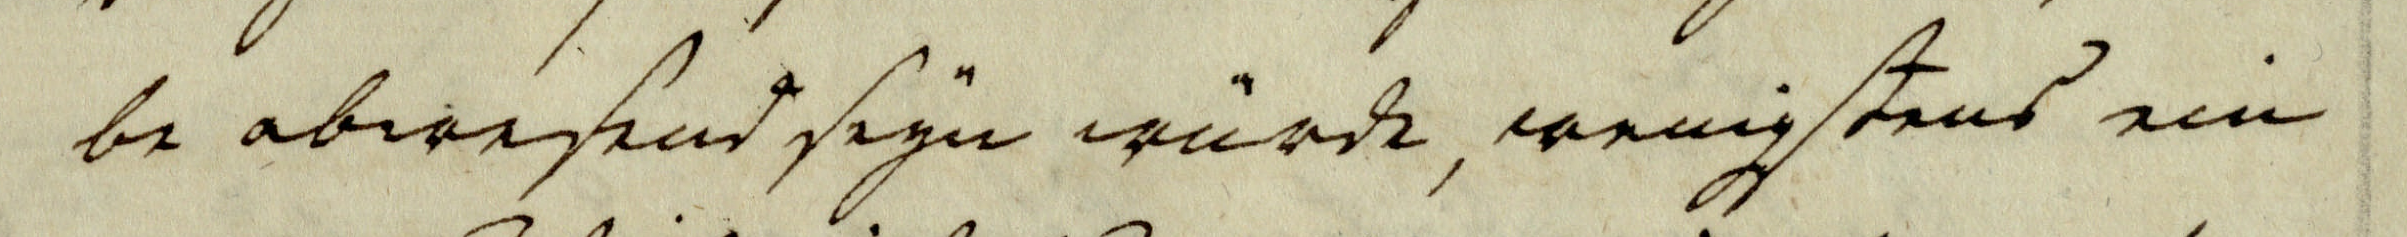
be abwesend seÿn würde, wenigstens ein
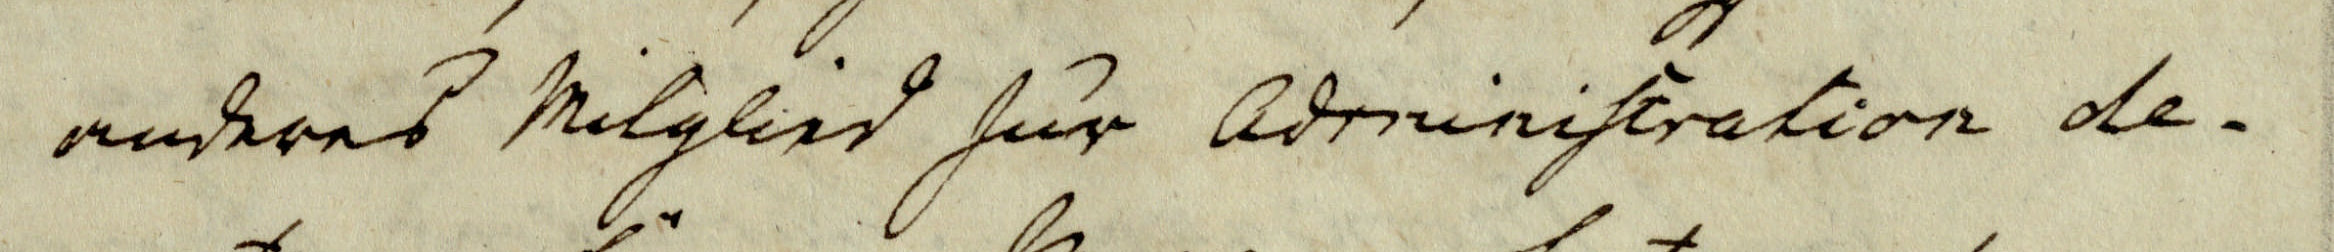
anderes Mitglied zur Administration de¬
